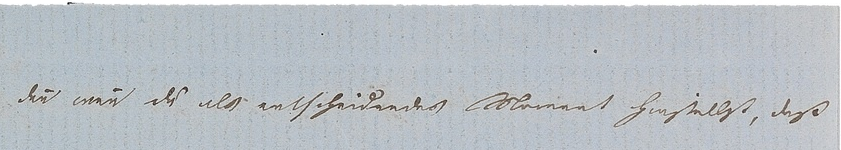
entscheidendes Moment
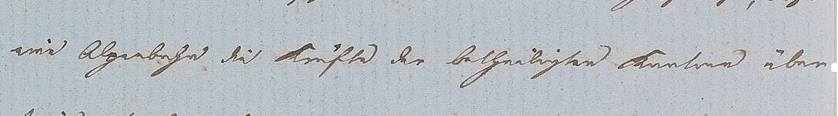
eine Alpenbahn die Kräfte der betheiligten Kantone über-
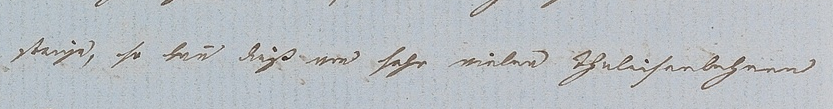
steige, so kann dieß von sehr vielen Thaleisenbahnen
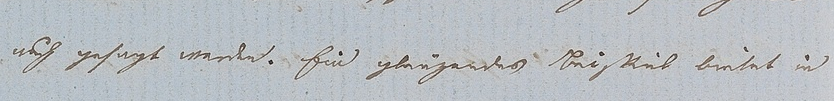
auch gesagt werden. Ein glänzendes Beispiel bietet in
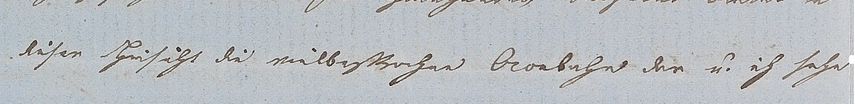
dieser Hinsicht die vielbesprochne Oron bahn dar u. ich sehe
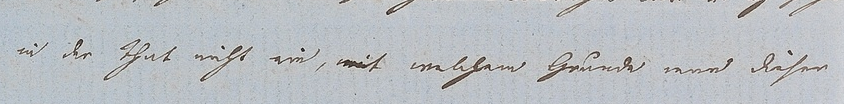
in der That nicht ein, mit welchem Grunde man dieser
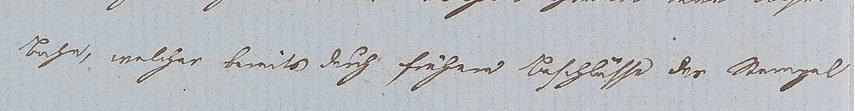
Bahn, welcher bereits durch frühere Beschlüsse der Stempel
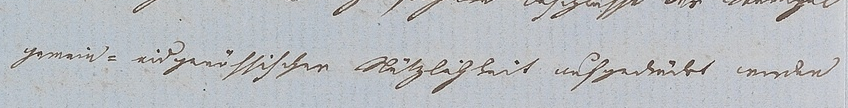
gemein-eidgenössischer Nützlichkeit aufgedrückt worden
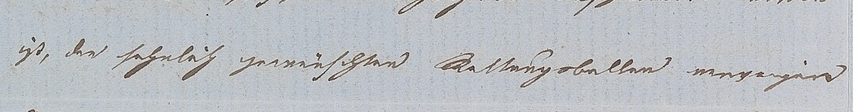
ist, den sehnlich gewünschten Rettungsbalken verweigern
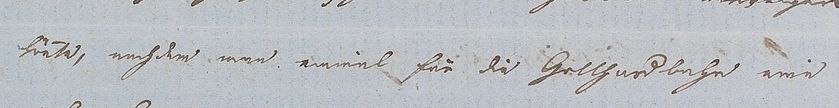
könnte, nachdem man einmal für die Gotthardbahn eine
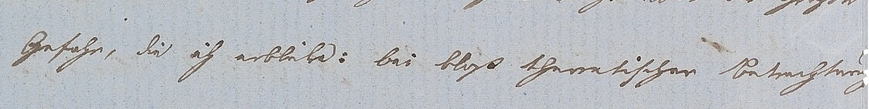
Gefahr, die ich erblicke: bei bloß thematischer Betrachtung
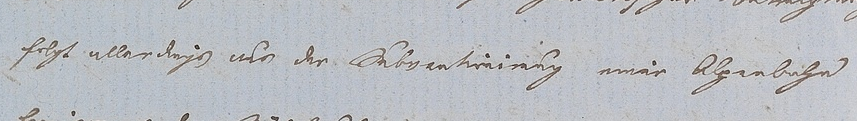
folgt allerdings aus der Subventionirung einer Alpenbahn
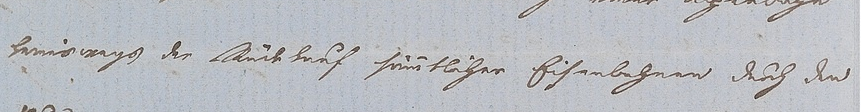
keineswegs der Rückkauf sämmtlicher Eisenbahnen durch den
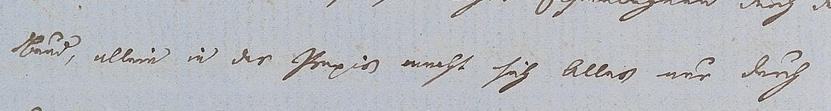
Bund, allein in der Praxis macht sich Alles nur durch
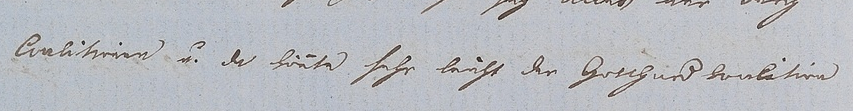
Coalitionen u. da könnte sehr leicht der Gotthardkoalition
